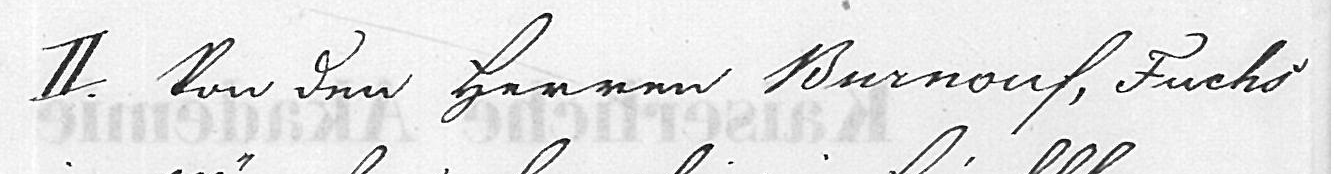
II. Von den Herren Burnouf, Fuchs
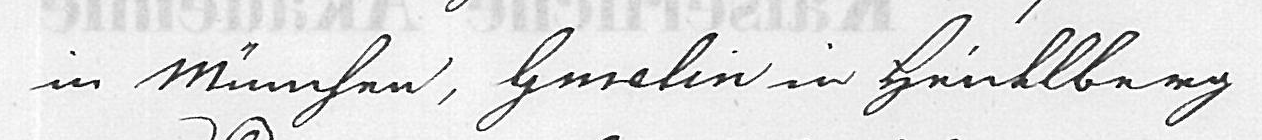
in München, Gmelingin Heidelberg
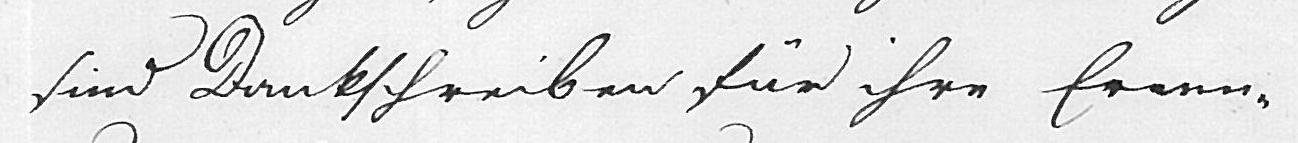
sind Dankschreiben für ihre Ernen-
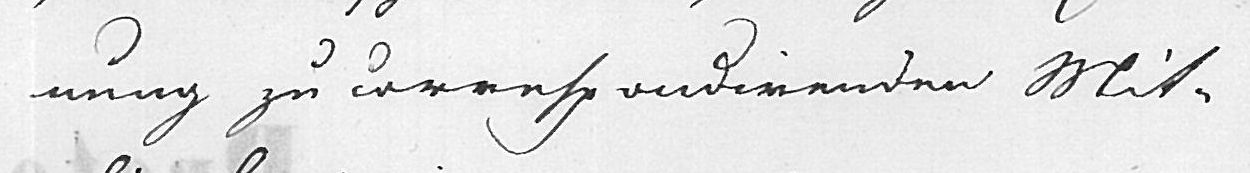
nung zu correspondirenden Mit-
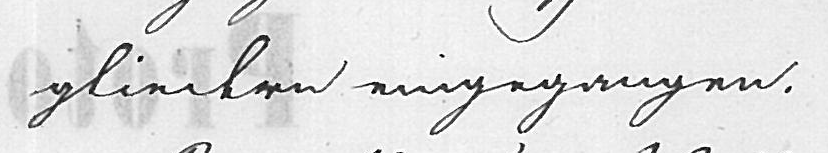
gliedern eingegangen.
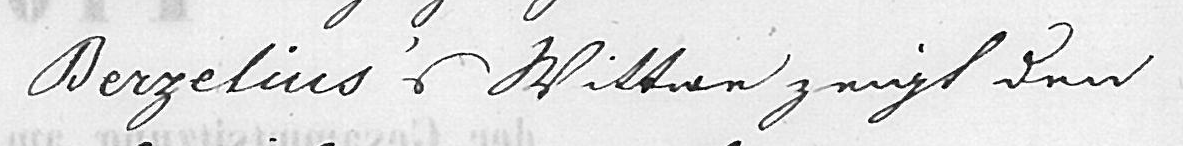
Berzelius's Wittwer zeigt den
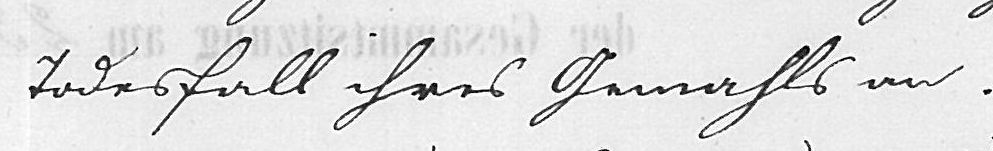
Todesfall ihren Gemahls an.
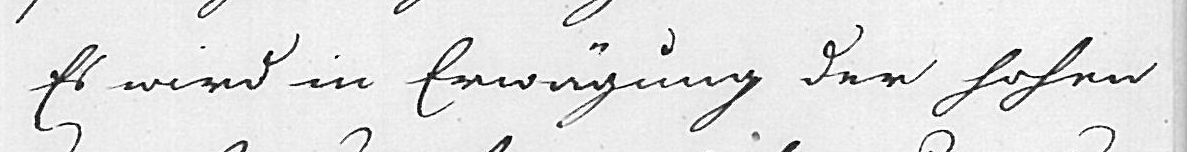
Es wird im Erwägung der hohen
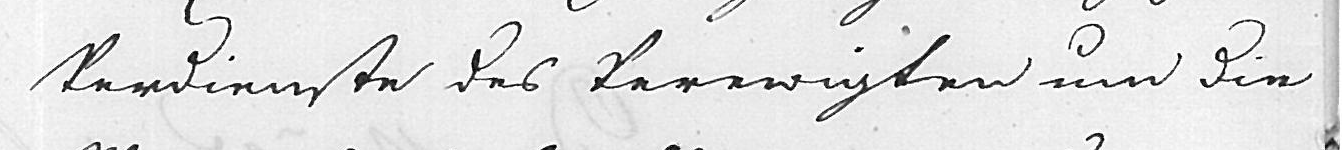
Verdienste des Verewigten um die
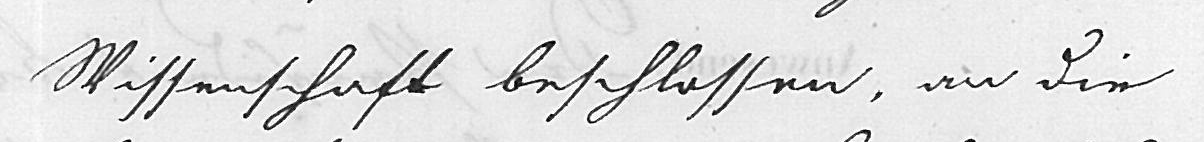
Wissenschaft beschlossen, an die
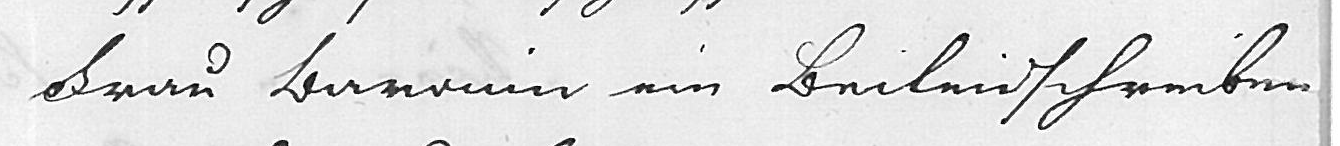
Frau Baronin ein Beileidschreiben
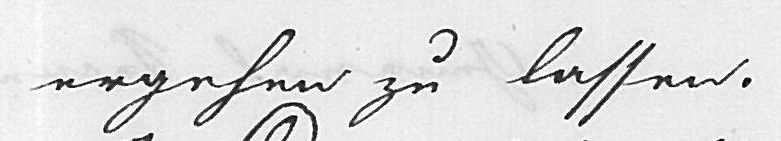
ergehen zu lassen.
